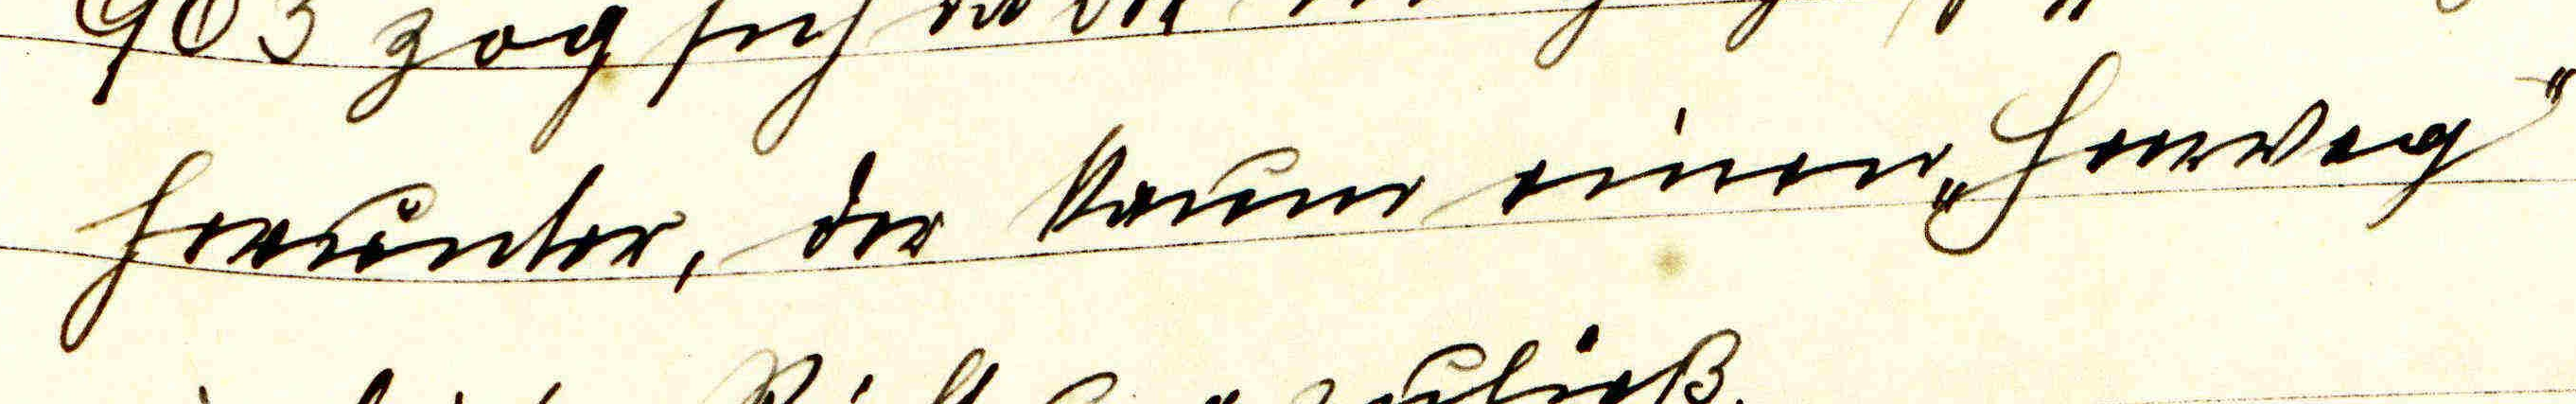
herunter, der kaum einen „Heerweg“
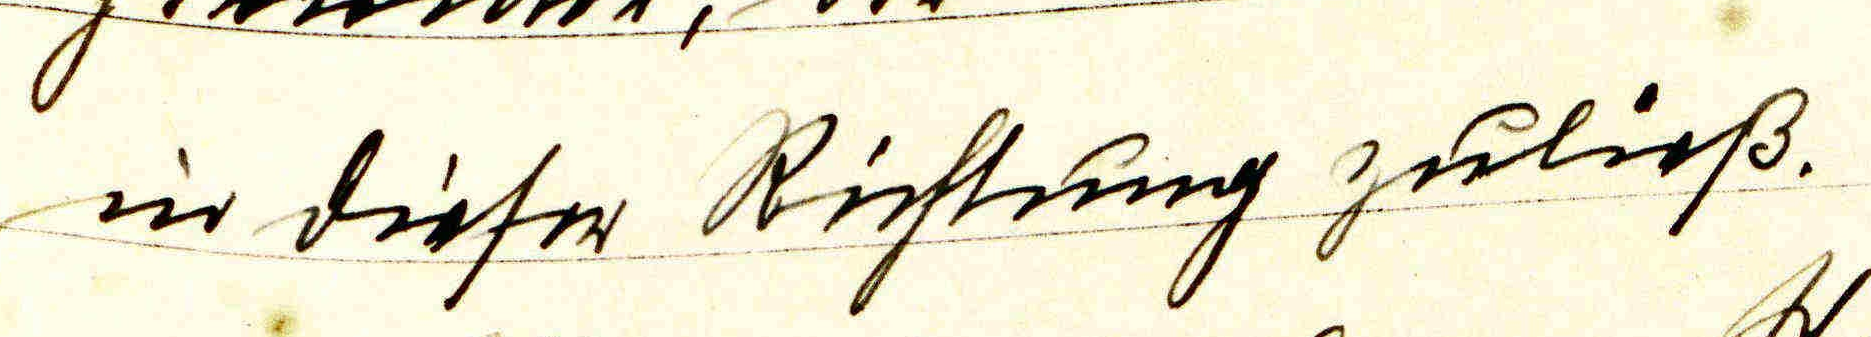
in dieser Richtung zuließ.
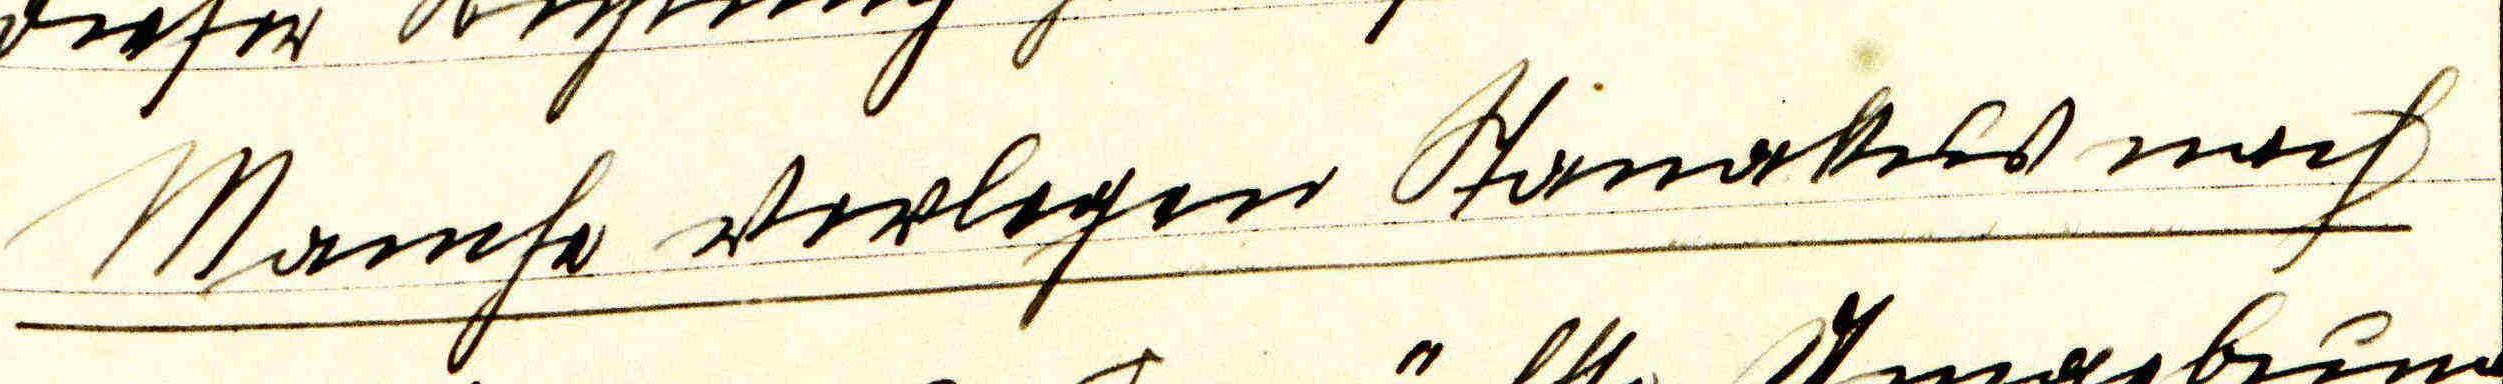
Manche verlegen Stanakus nach
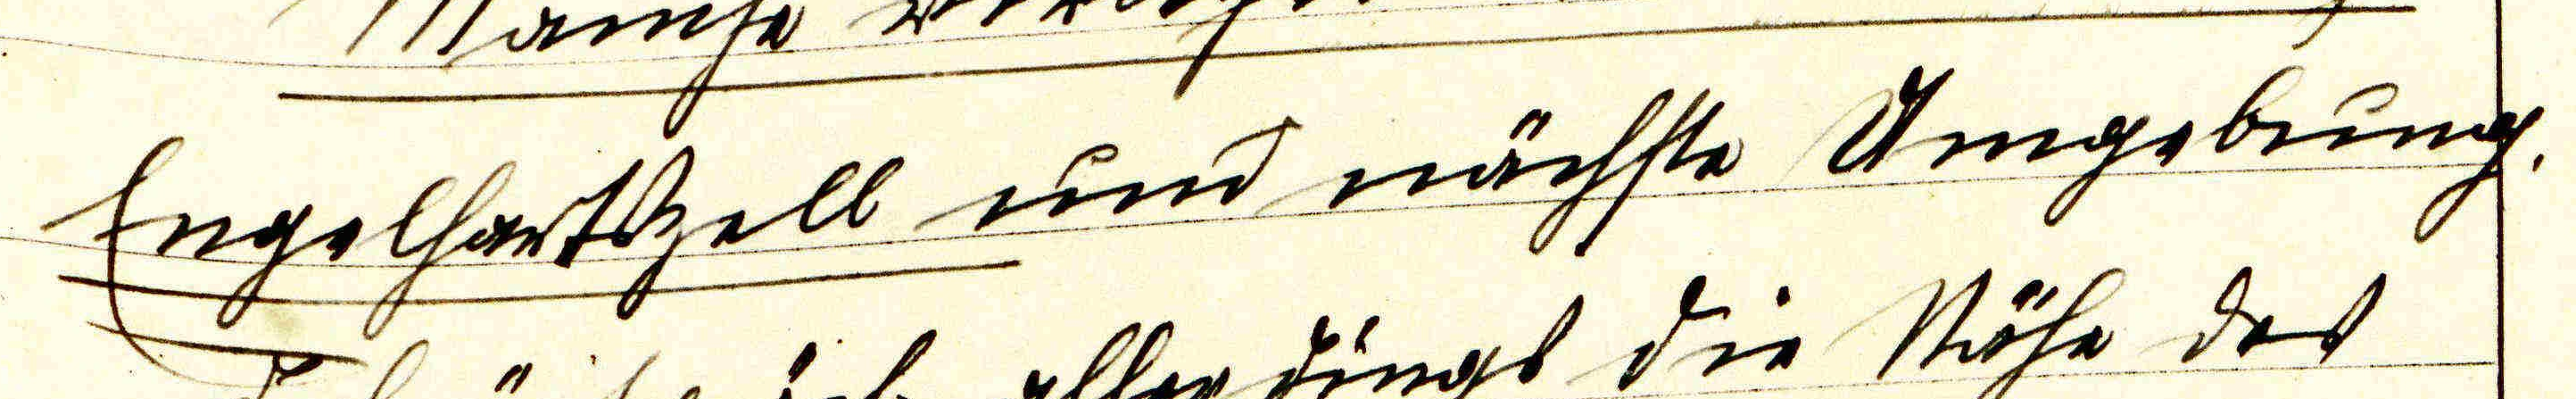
Engelhartszell und nächste Umgebung.
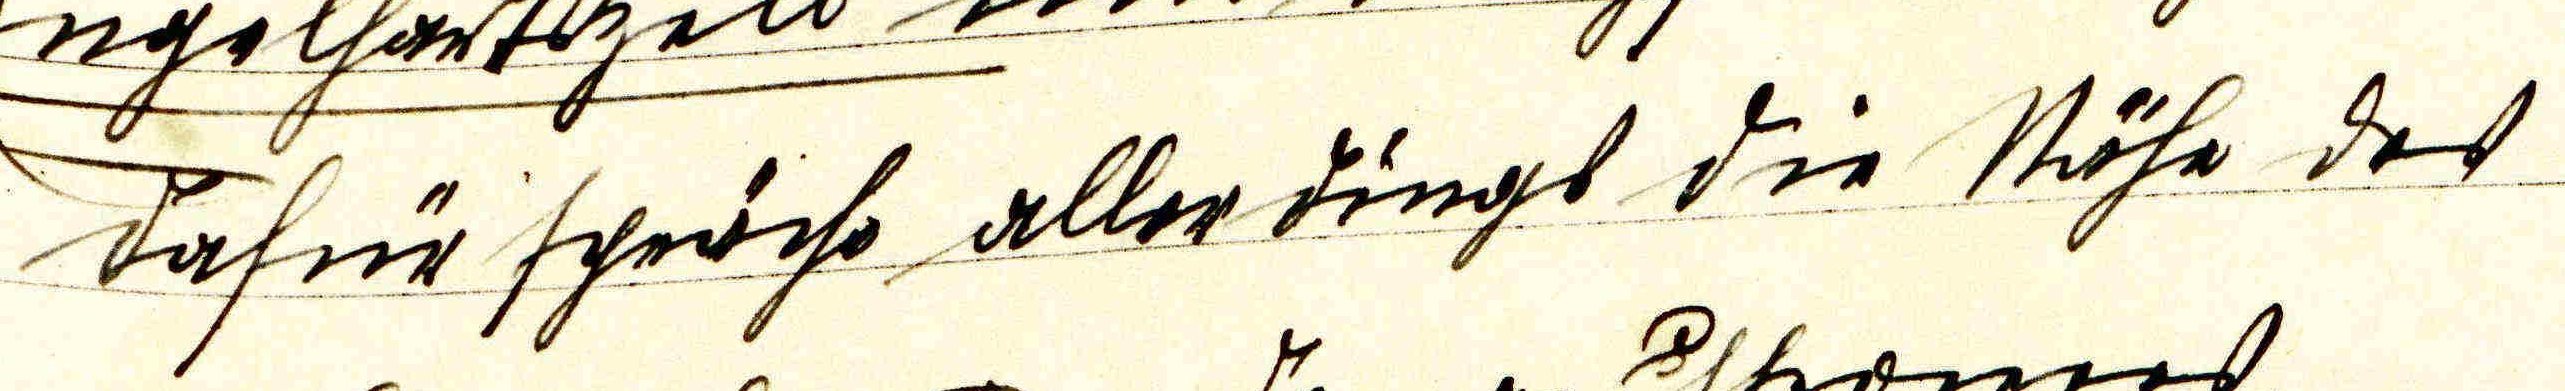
Dafür spräche aller Dings die Nähe des
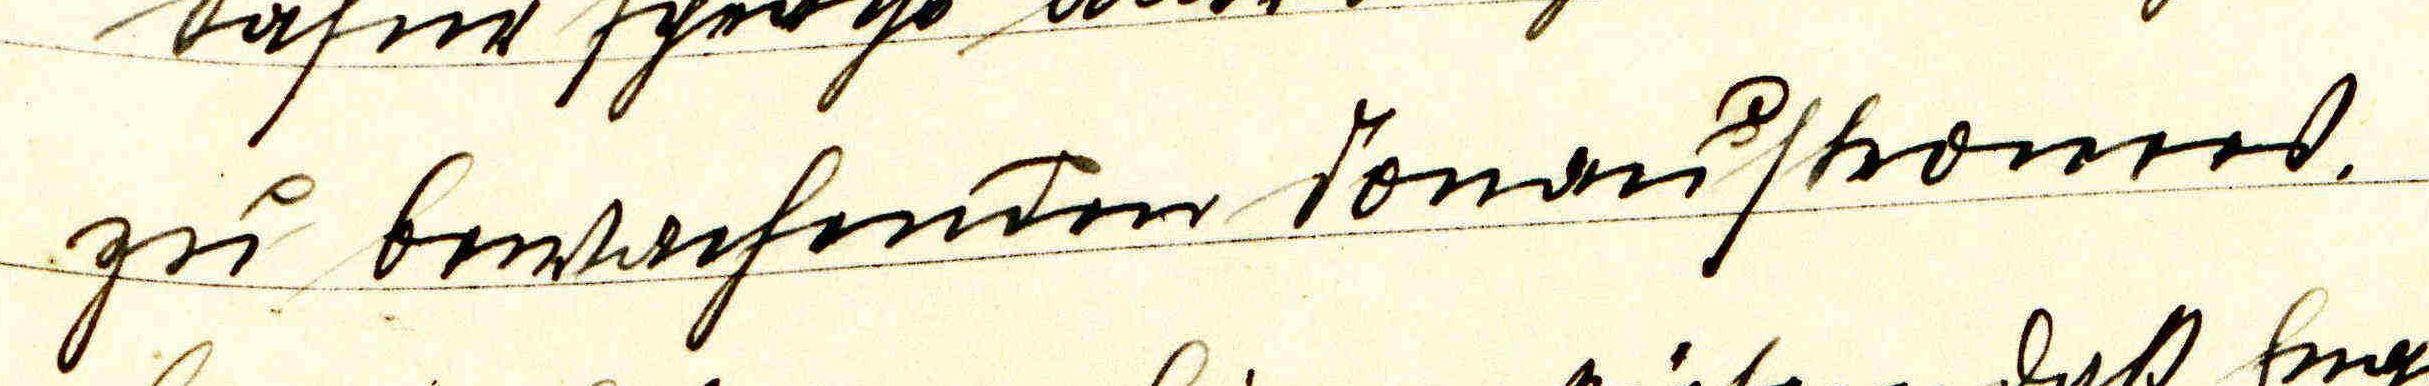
zu bewachenden Donaustromes.
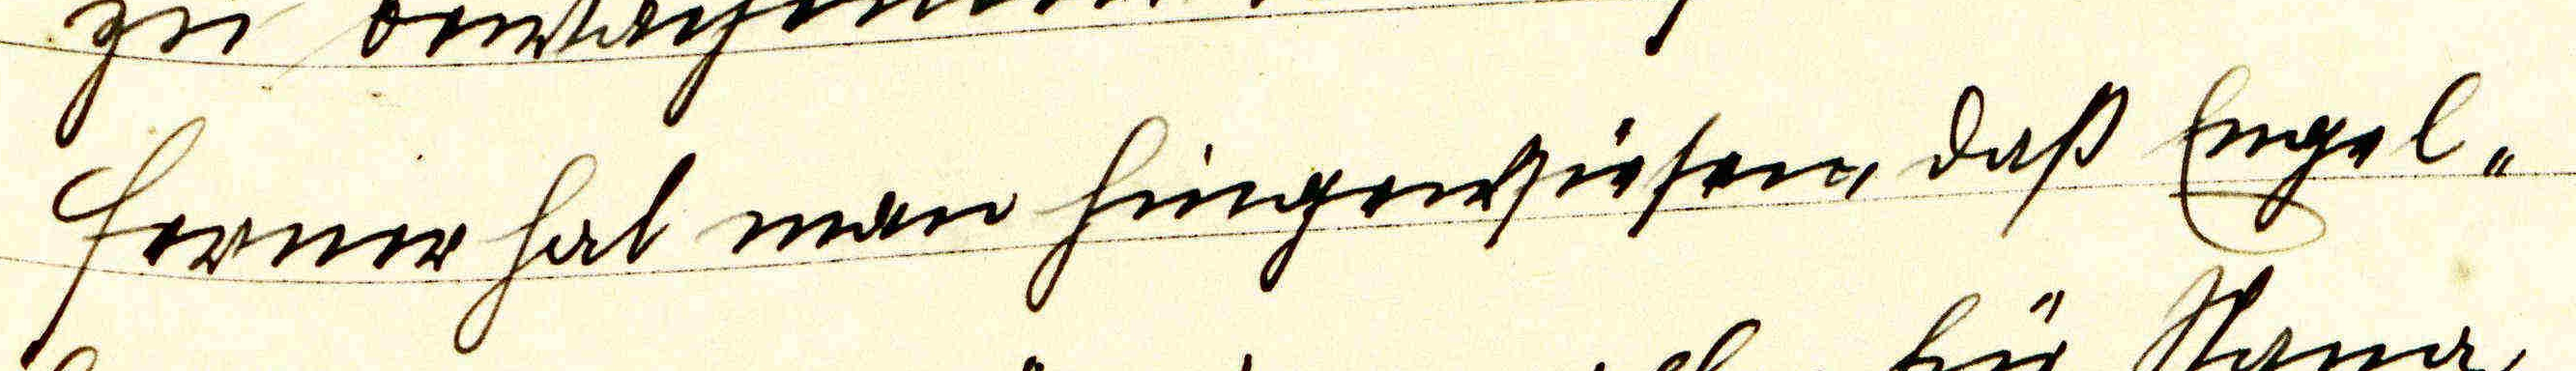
Ferner hat man hingewisen, daß Engel-
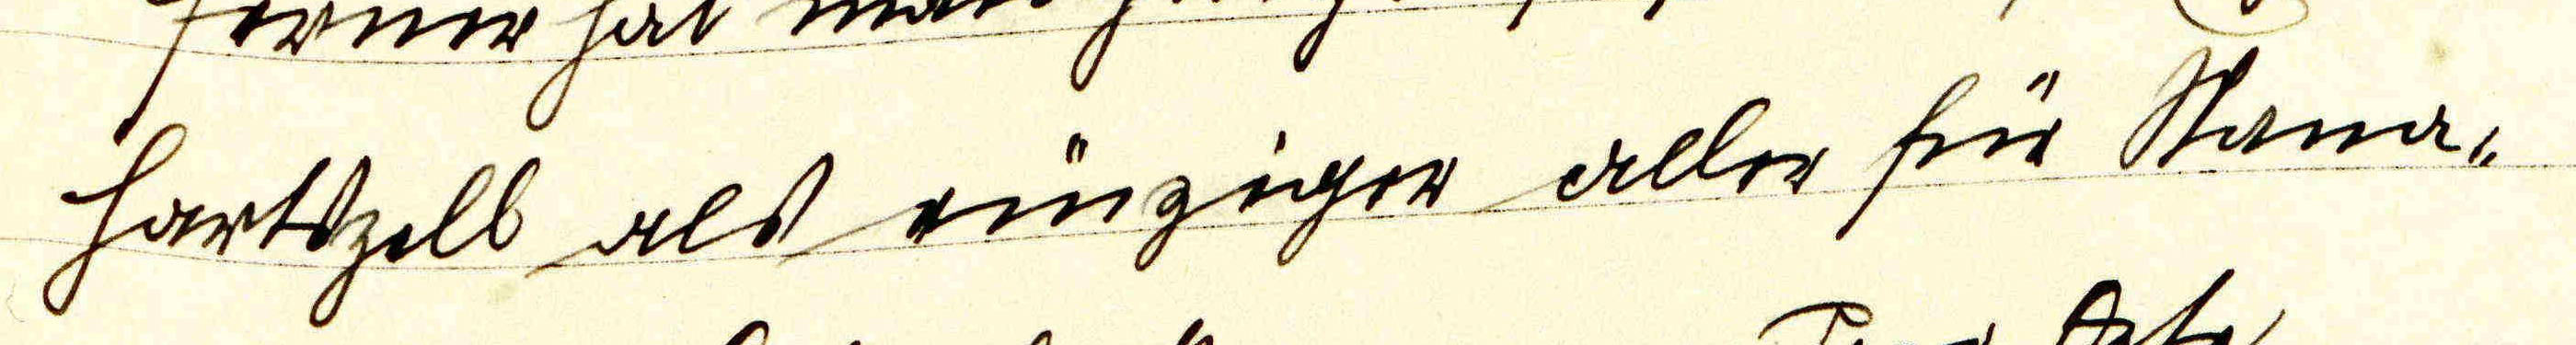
hartszell als einziger aller für Stana-
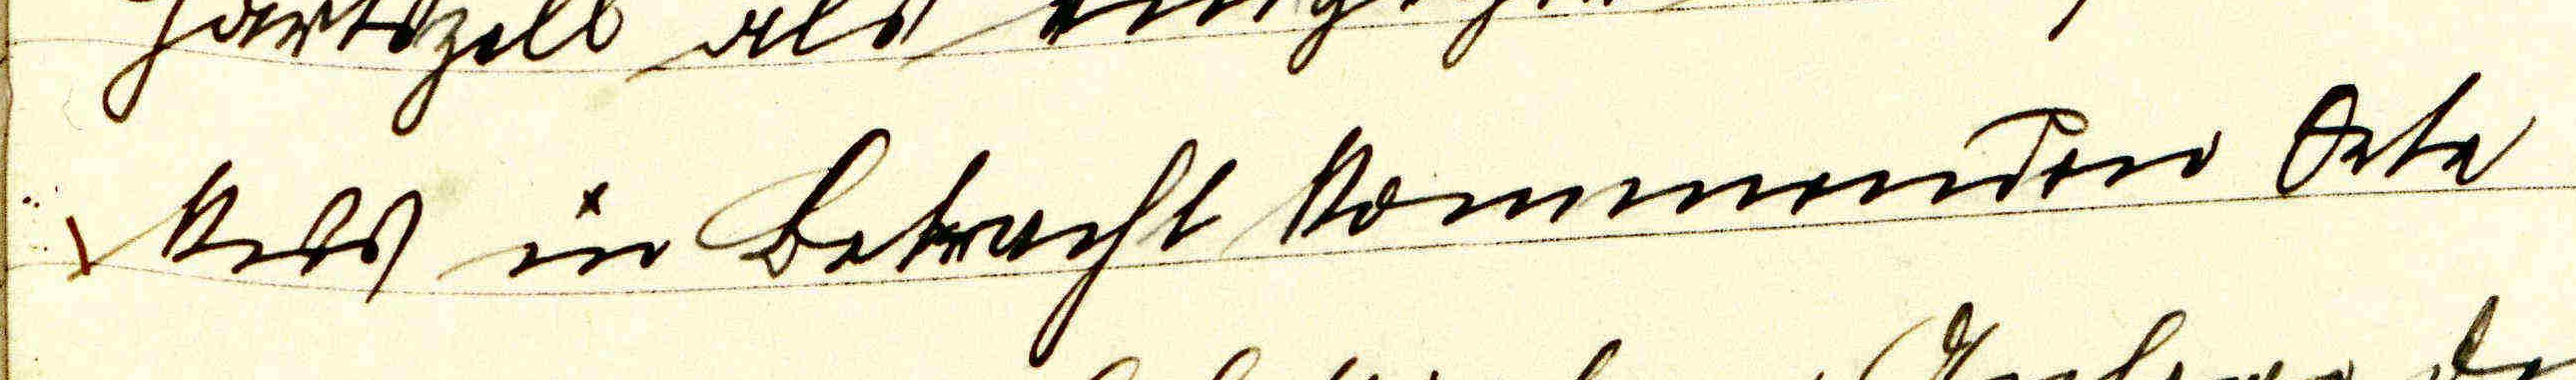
kus in Betracht kommenden Orte
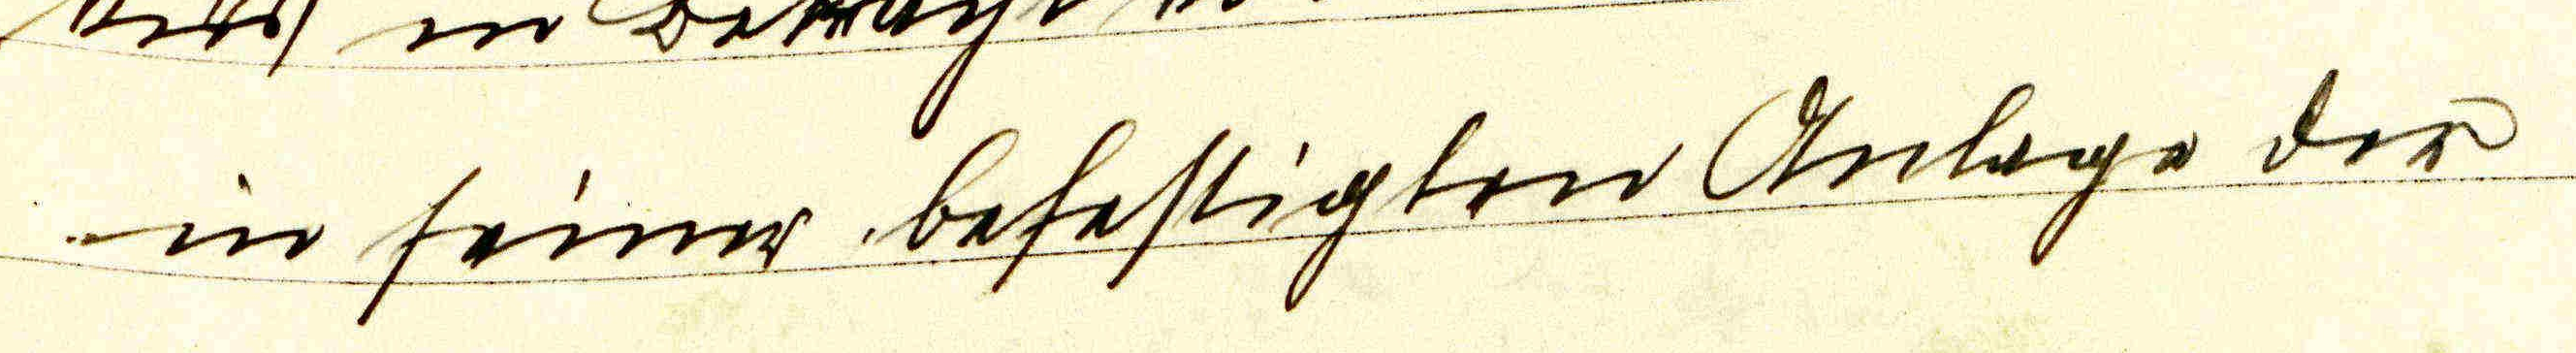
in seiner befestigten Anlage der
